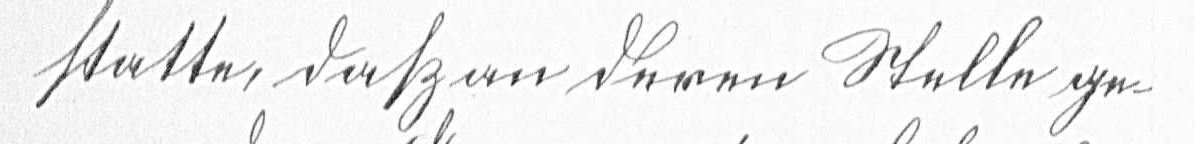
statte, daß an deren Stelle ge¬
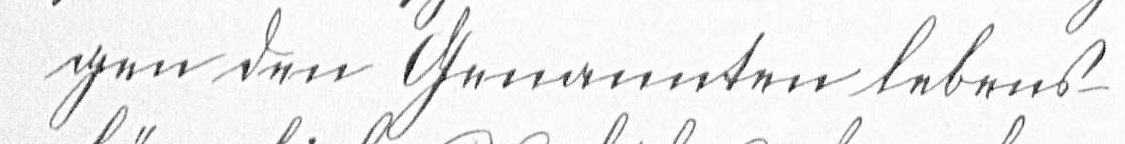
gen den Genannten lebens¬
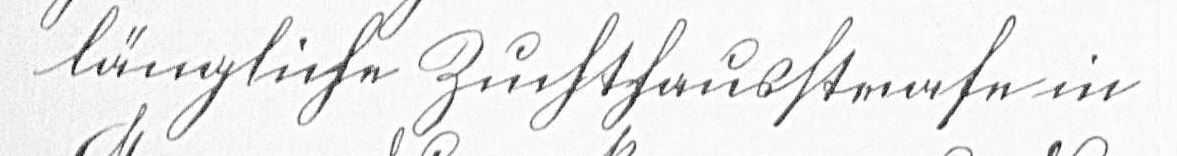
längliche Zuchthausstrafe in
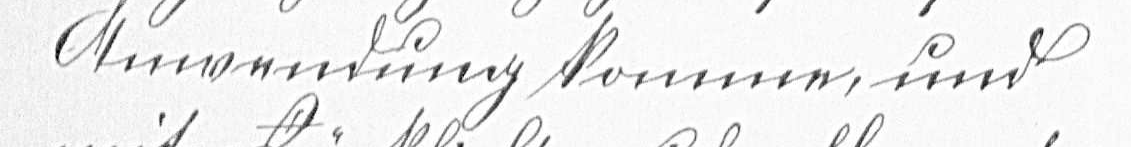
Anwendung komme, und
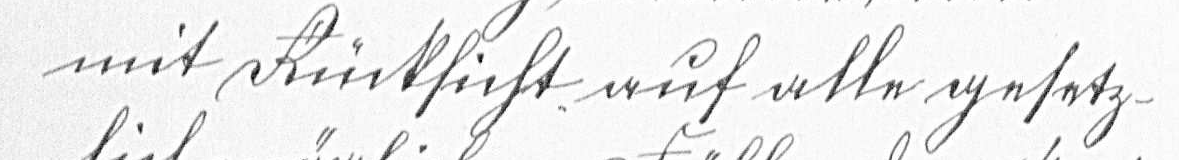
mit Rücksicht auf alle gesetz¬
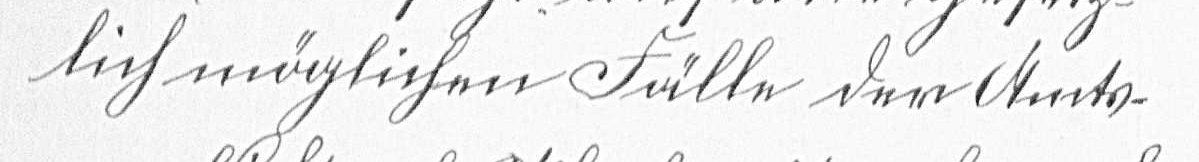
lich möglichen Fälle der Amts¬
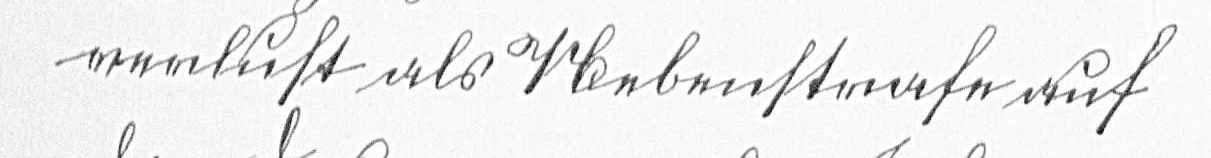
verlust als Nebenstrafe auf
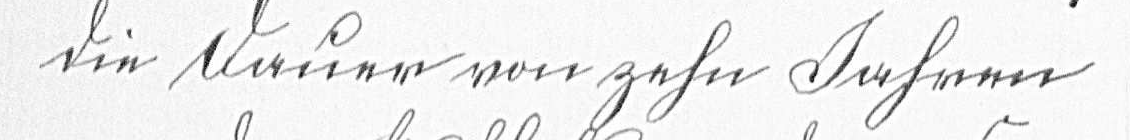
die Dauer von zehn Jahren
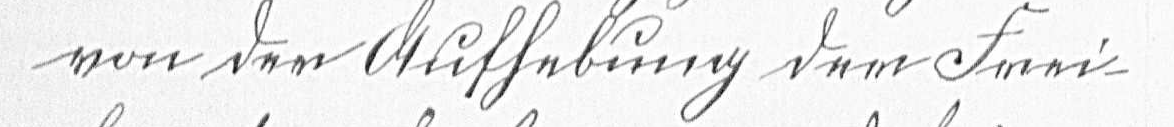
von der Aufhebung der Frei¬
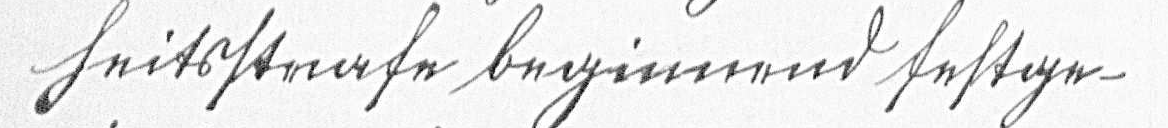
heitsstrafe beginnend festge¬
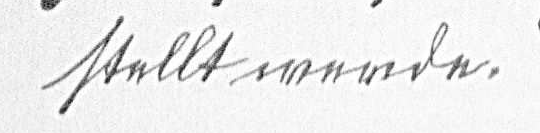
stellt werde.
